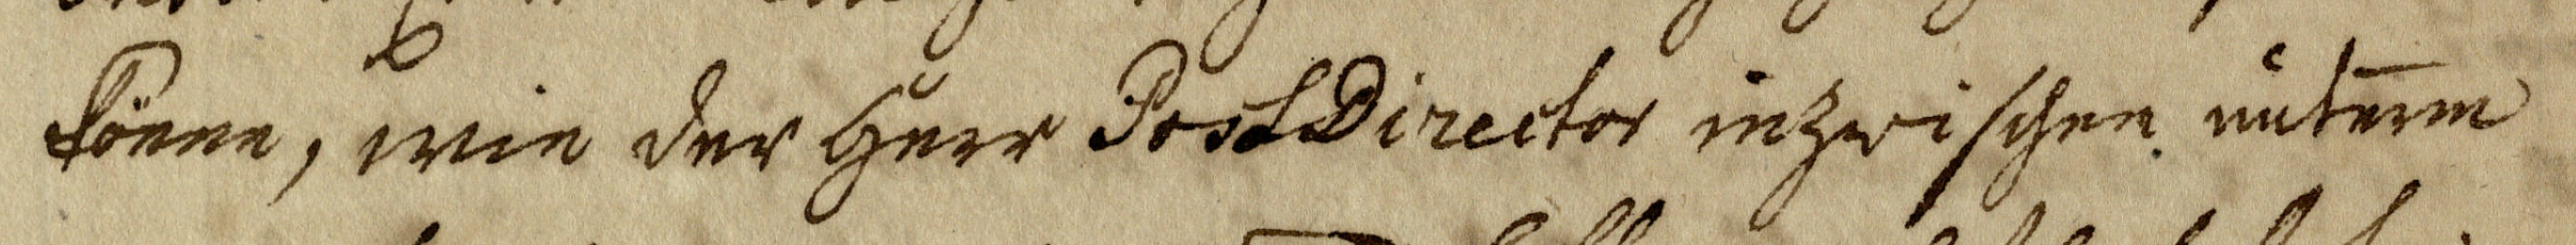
könne, wie der Herr PostDirector inzwischen unterm
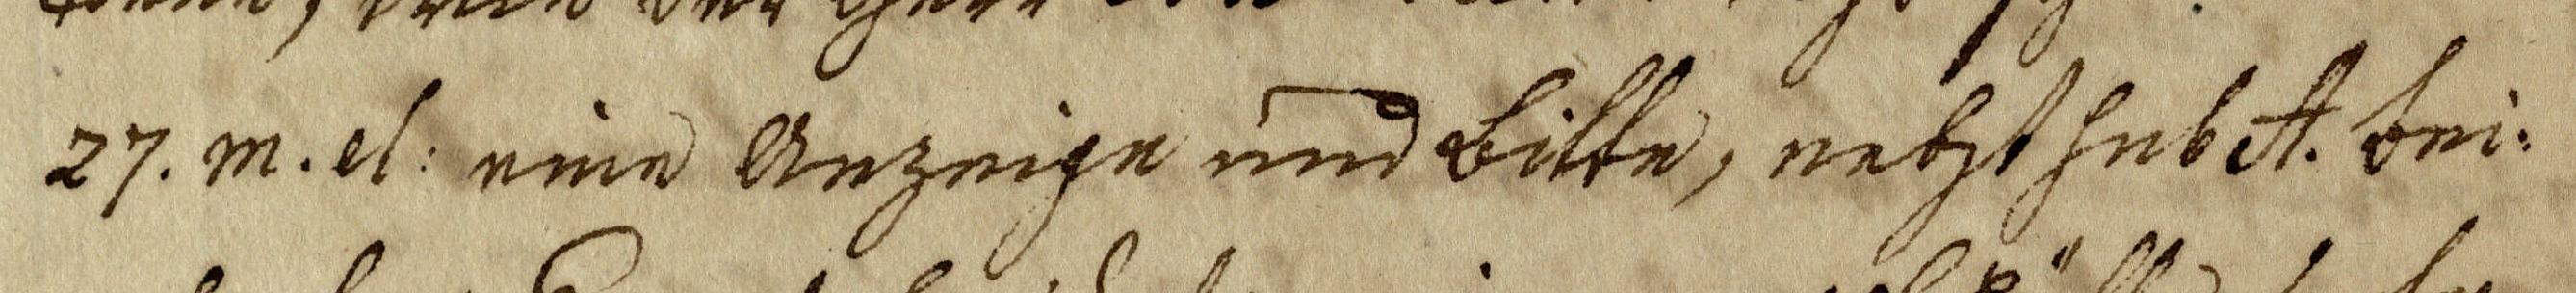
27. m el. eine Anzeige und Bitte, nebst sub A. bei¬
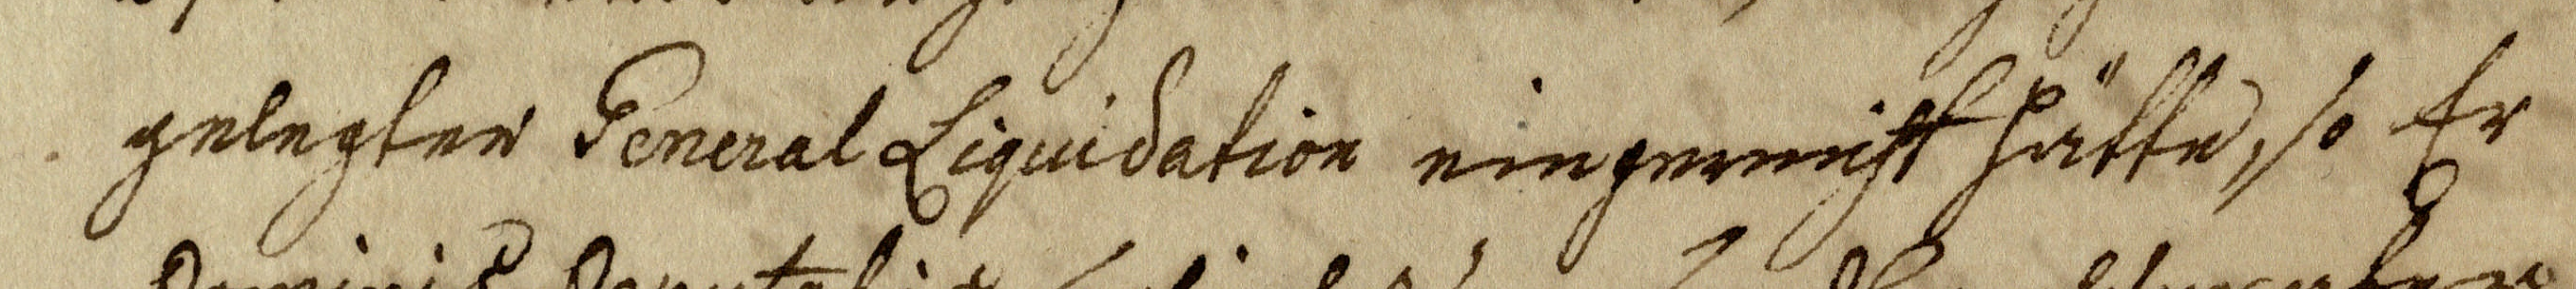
gelegter General Liquidation eingereicht hätte, so Er
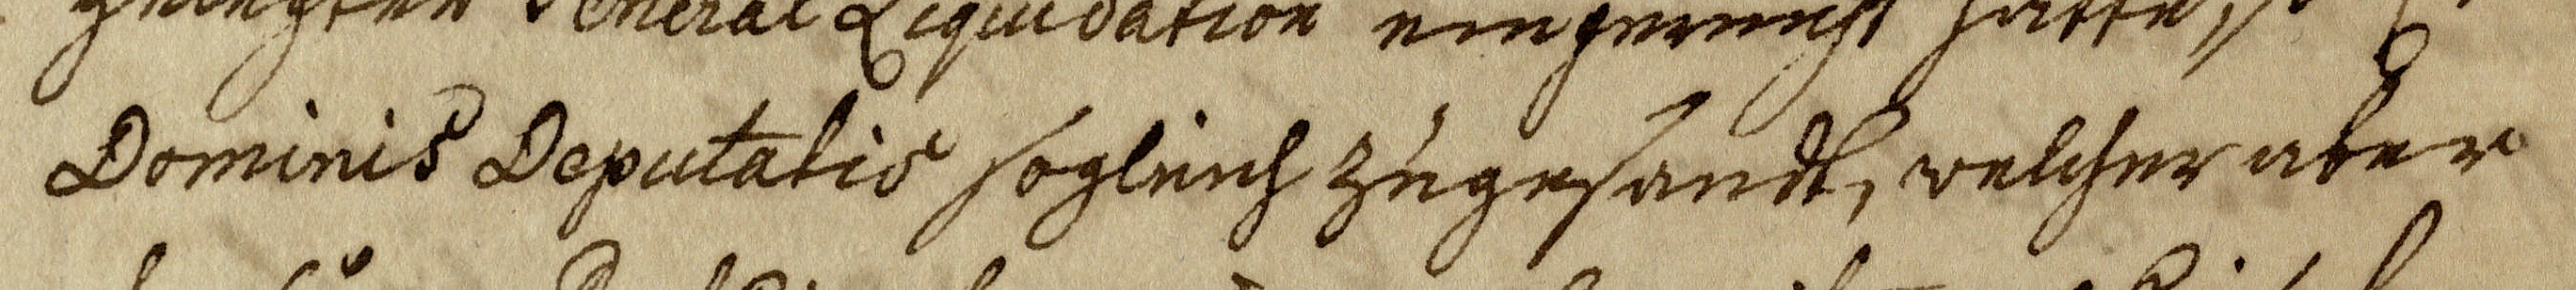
Dominis Deputatis sogleich zugesandt, welcher aber
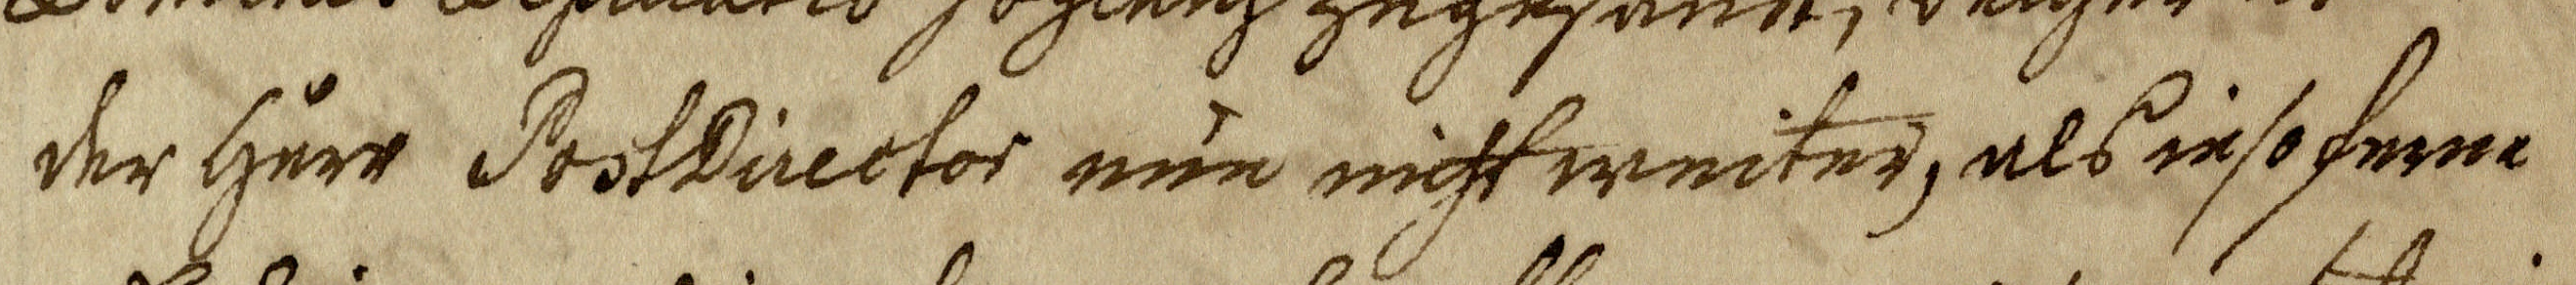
der Herr PostDirector nun nicht weiter, als so ferne
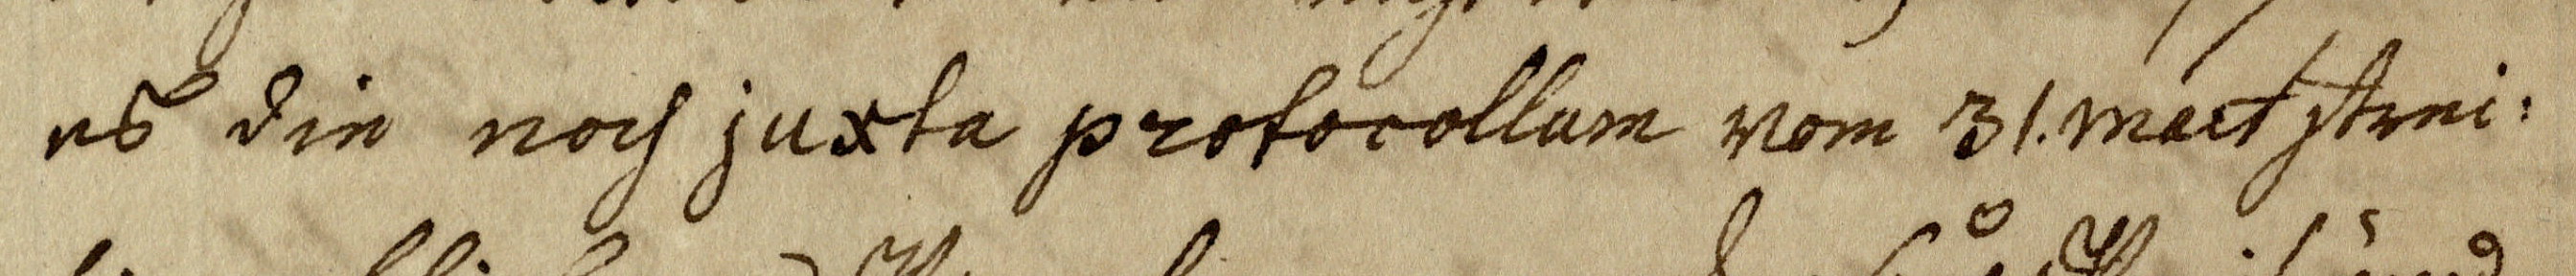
es die noch juxta protocollum vom 31. mart strei¬
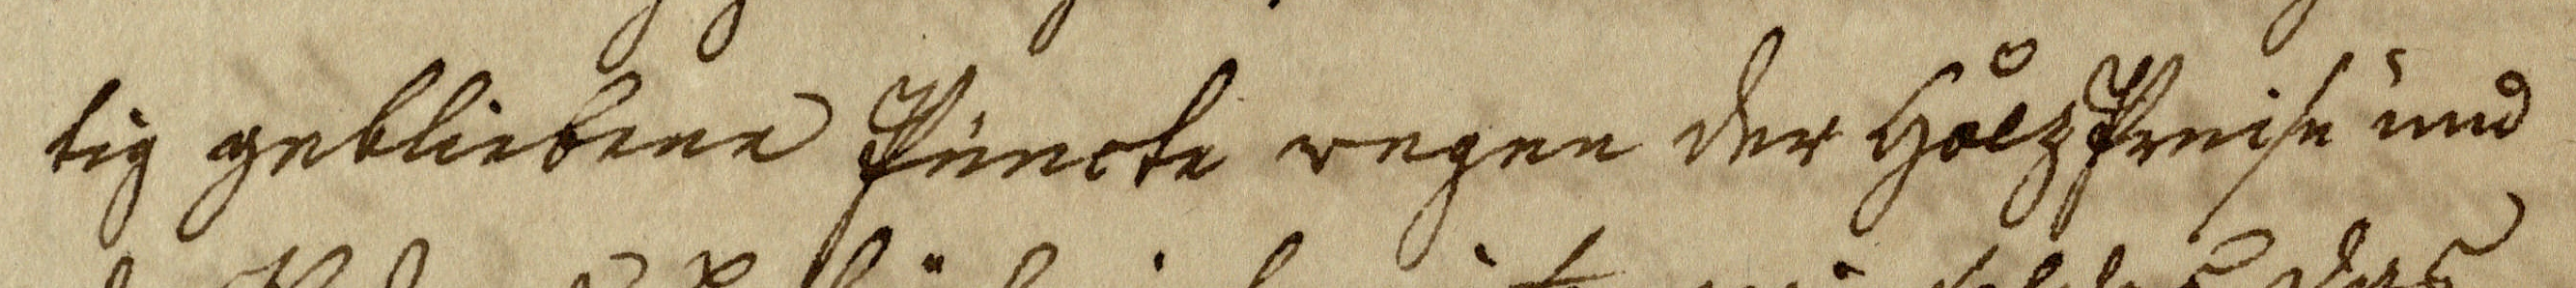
tig gebliebene Puncte wegen der HolzPreise und
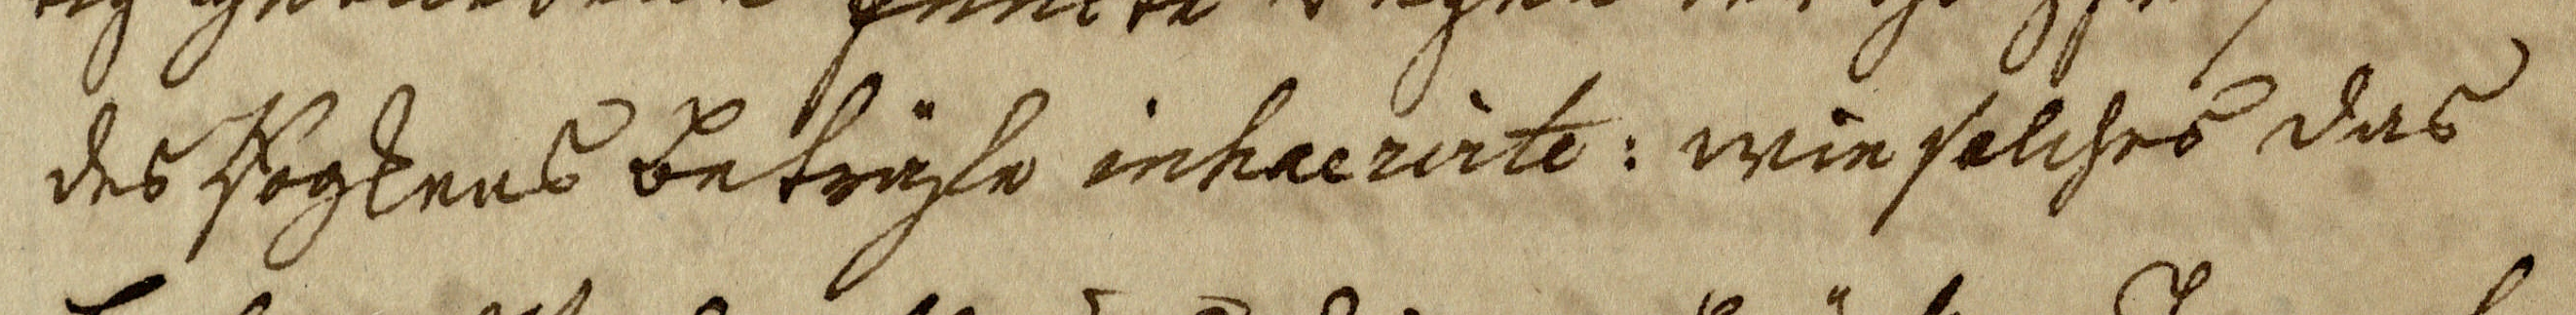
des Rogkens beträfe inhaerirte. wie solches das
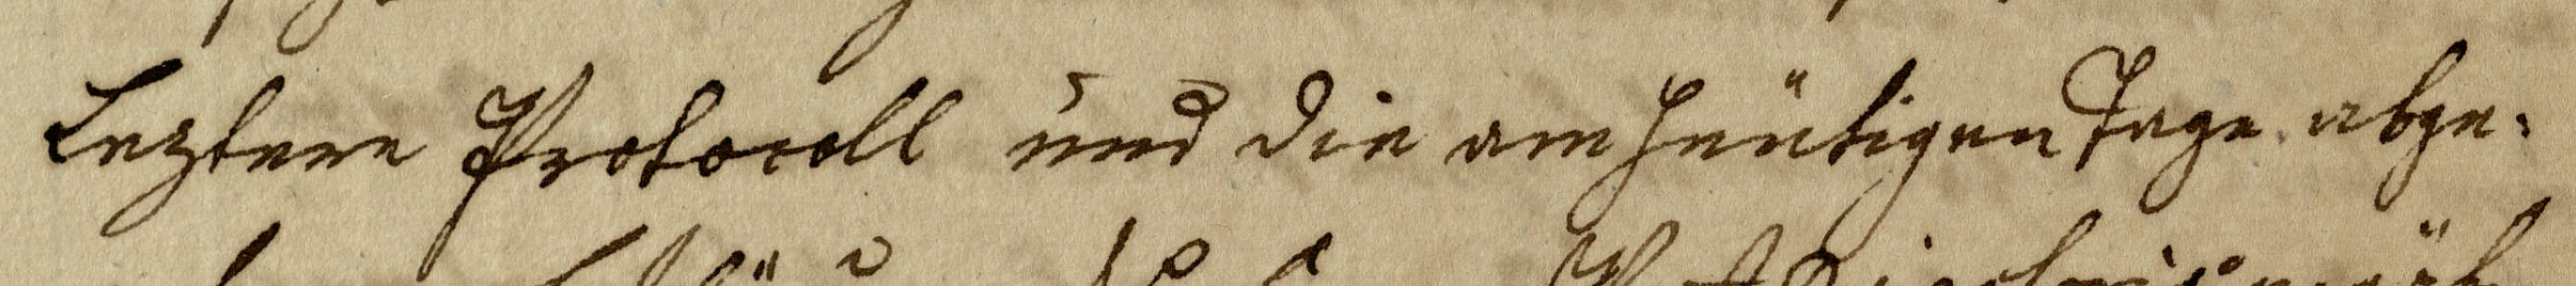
leztere Protocoll und die an heutigen Tage abge¬
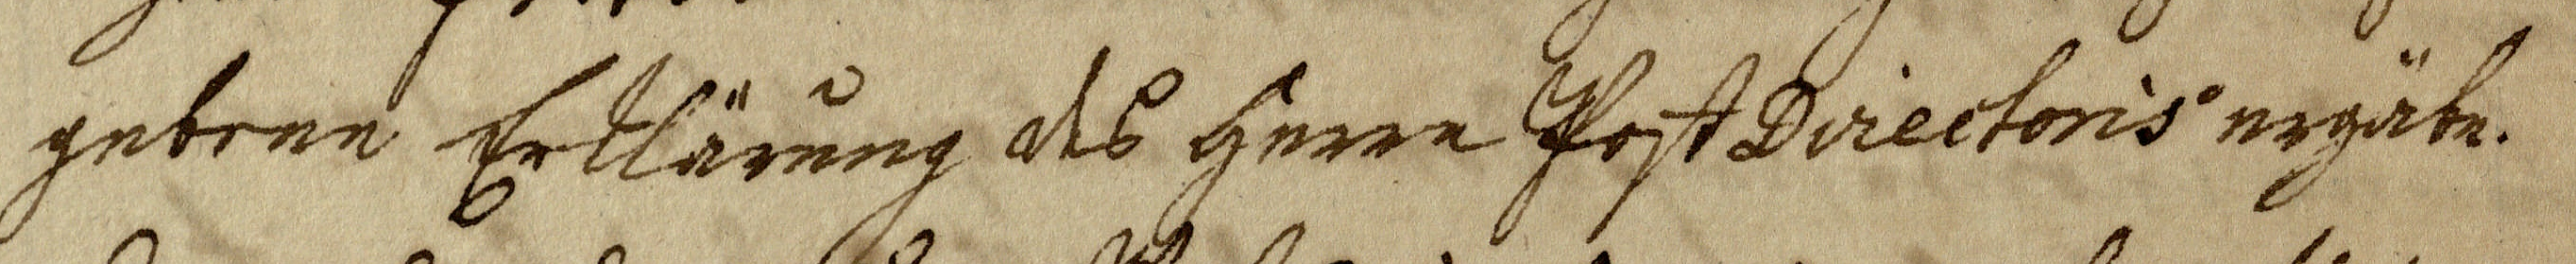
gebene Erklärung des Herrn Post Directoris ergäbe.
